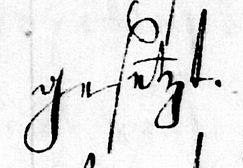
gesetzt.
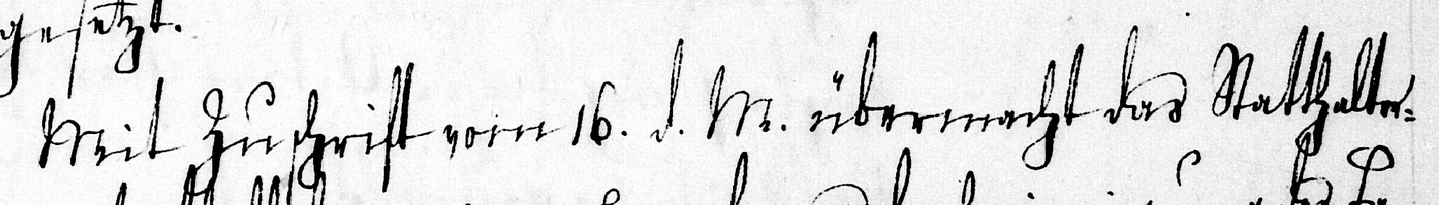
Mit Zuschrift vom 16. d. M. übermacht das Statthalt¬
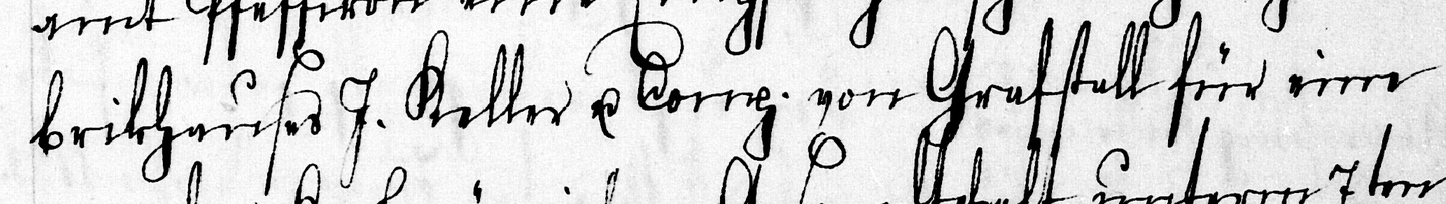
brikhauses J. Keller u. Comp. von Grafstall für eine
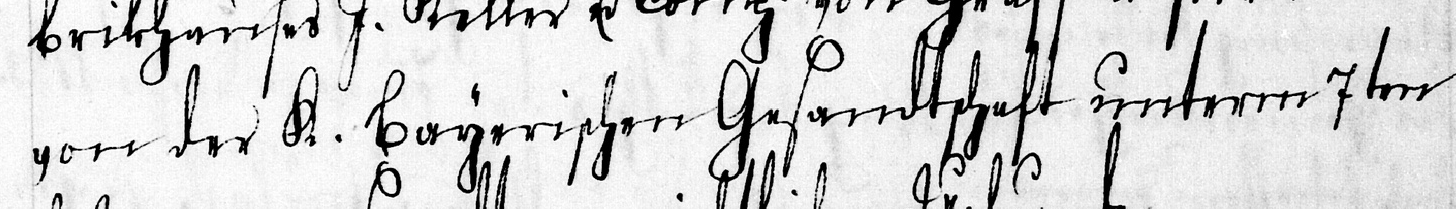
von der K. Bayerischen Gesandtschaft unterm 7ten
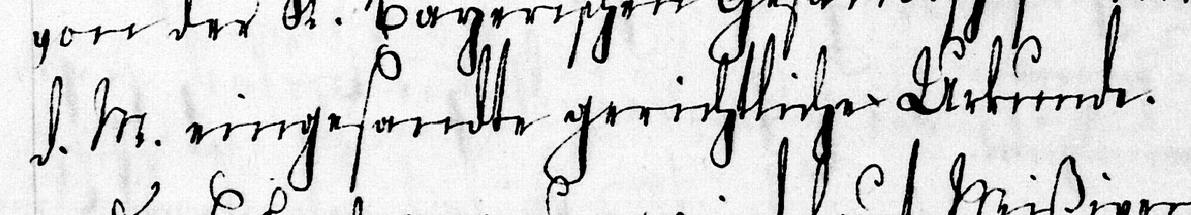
d. M. eingesandte gerichtliche Urkunde.
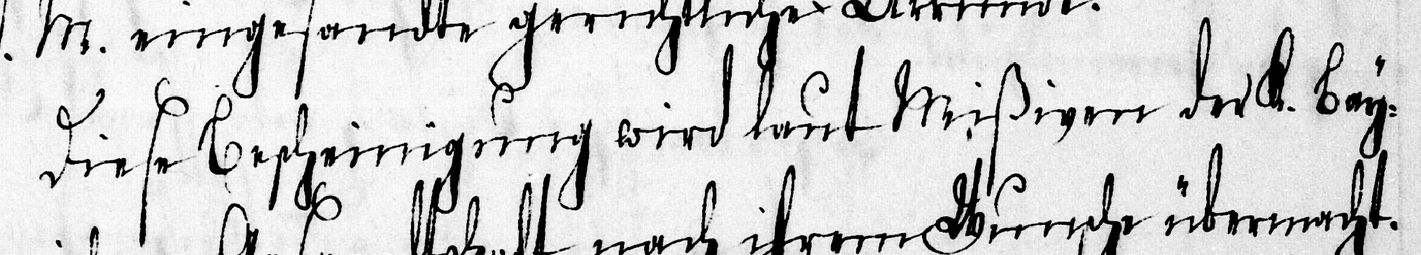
Diese Bescheinigung wird laut Mißiven der K. Bay¬
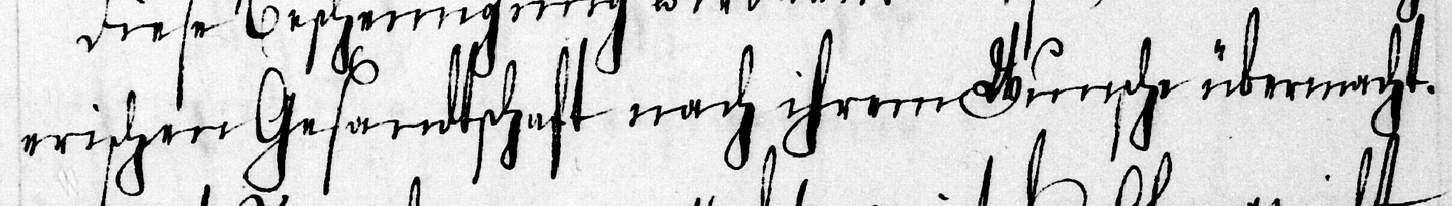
erischen Gesandtschaft nach ihrem Wunsche übermacht.
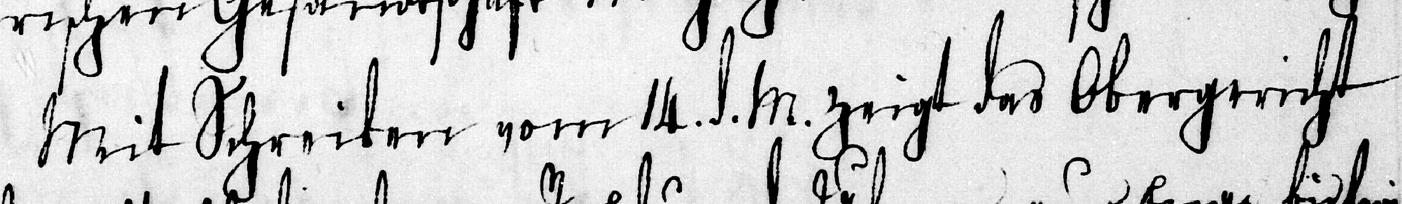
Mit Schreiben vom 14. d. M. zeigt das Obergericht
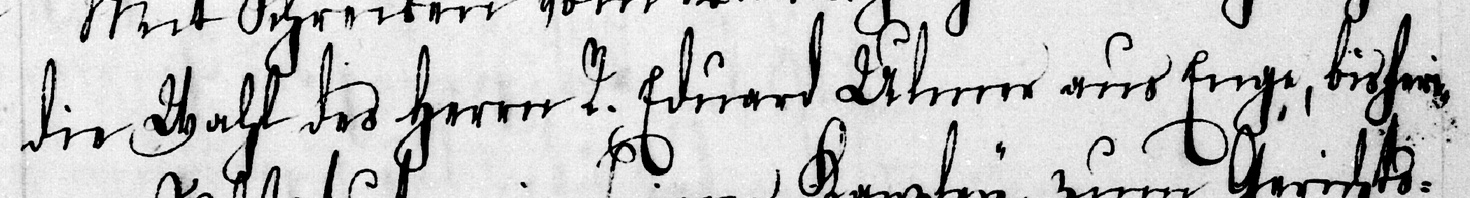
die Wahl des Herrn R. Eduard Ulmer aus Enge, bisher¬
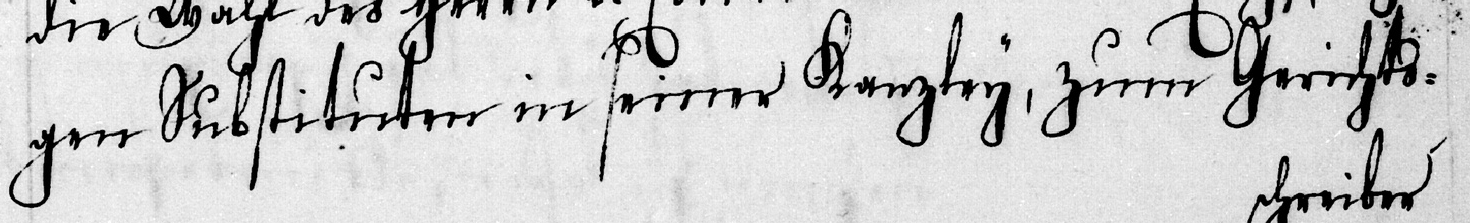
igen Substituten in seiner Kanzley, zum Gerichts-
